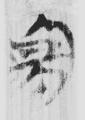{勹昜}
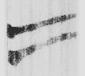二
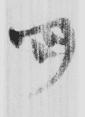月
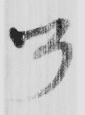乃
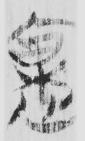裹
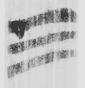三
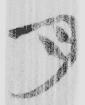月
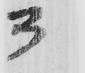乃
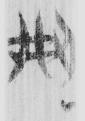刑
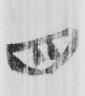四
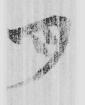月
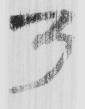乃
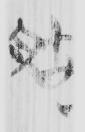{肉古}
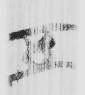五
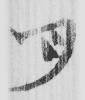月
